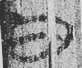白
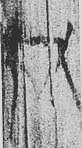夂（終）
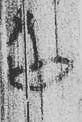身
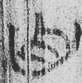自
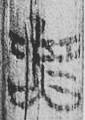若
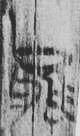能
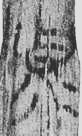○（寡）
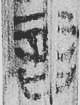言
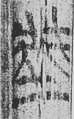○（乎）
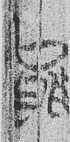能
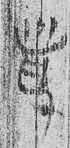○（一）
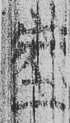○（乎）
